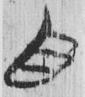目
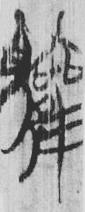觀
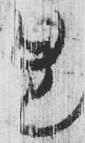也
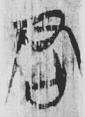君
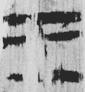王
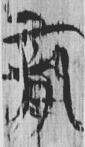龍（隆）
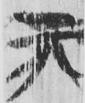亓（其）
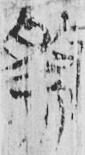祭
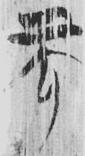而
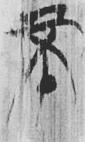不
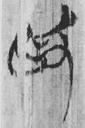爲
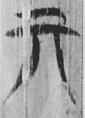亓（其）
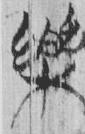樂
